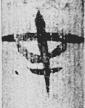才（哉）
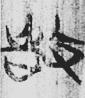○（曹）
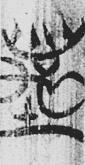○（沫）
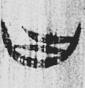曰
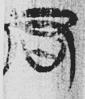君
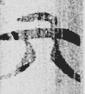亓
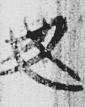母
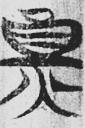員（愪）
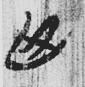臣
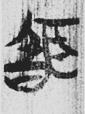○（聞）
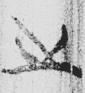之
